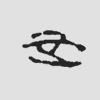正
